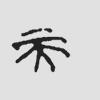天
